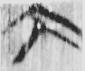大
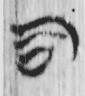司
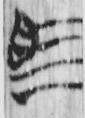馬
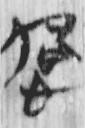○（悼）
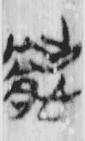○（滑）
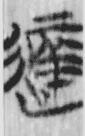𬨭（將）
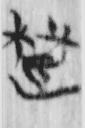楚
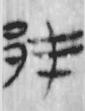邦
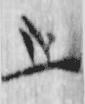之
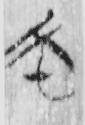帀（師）
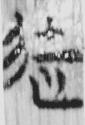徒
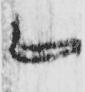㠯（以）
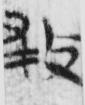○（救）
